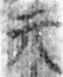亓（其）
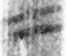二
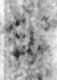才（在）
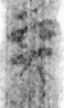長
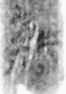{尾少}
